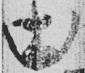山
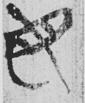母
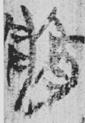○（逸）
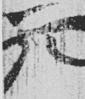亓
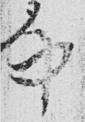身
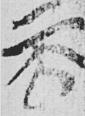而
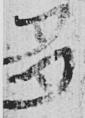多
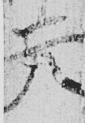亓
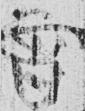言
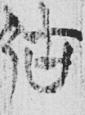居
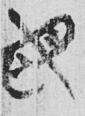母
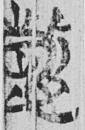悊（滯）
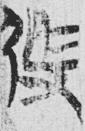拃（作）
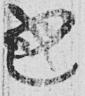母
